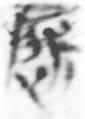所
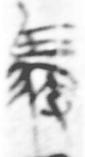馭（御）
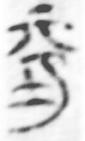坪（平）
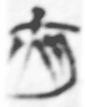夜
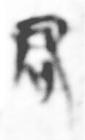君
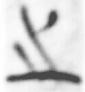之
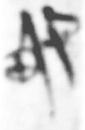○（畋）
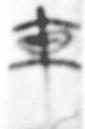車
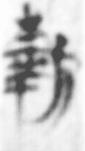新（新）
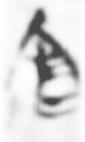官
